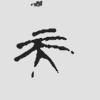天
